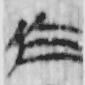於
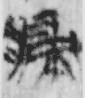寢
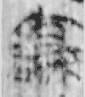寢
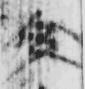交
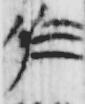於
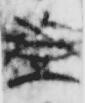者
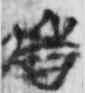俈
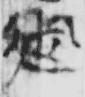○（卜）
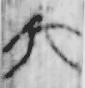六
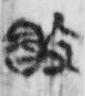○（令）
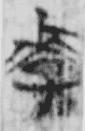李
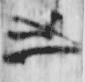之
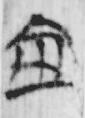金
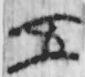五
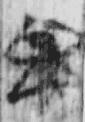益
